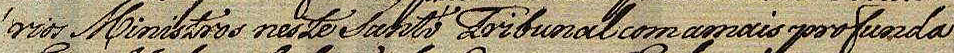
rios Ministros neste Santo Tribunal com a mais profunda
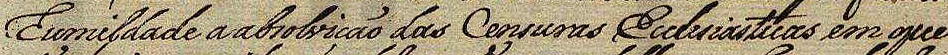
humildade a absolviçaõ das Censuras Ecclesiasticas em que
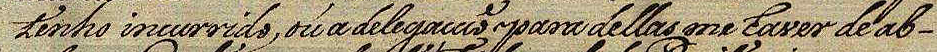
tenho incurrido, ou a delegaçaõ para dellas me haver de ab
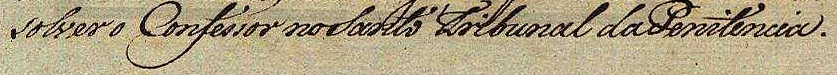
solver o Confessor no Santo Tribunal da Penitencia.
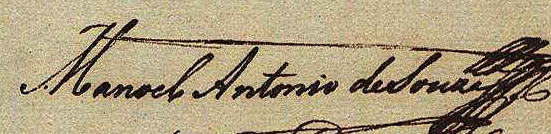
Manoel Antonio de Souza
